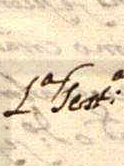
1a Testa:
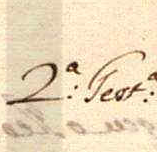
2a: Testa:
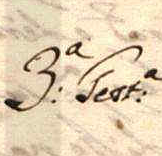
3.a Testa:
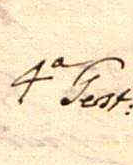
4a Testa:
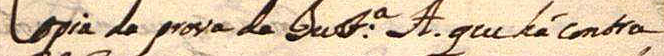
Copia da prova da Just.a A. que há contra
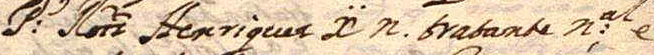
P:o Roiz̄ Henriquez x n. tratante n:al, e
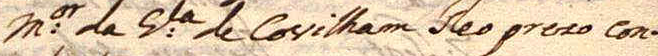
m:or da V:la de Covilham Reo prezo con
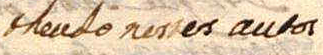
theudo nestes autos
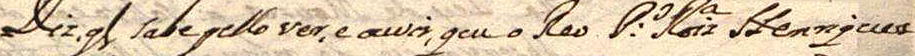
Diz. q̄ sabe pello ver, e ouvir, que o Reo P:o Roiz̄ Henriques
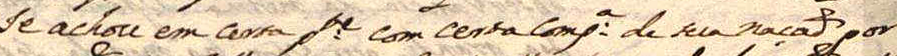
se achou em certa p:te com certa comp:a de sua naçaõ por
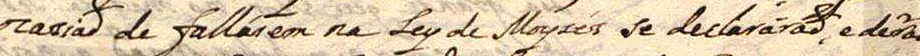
ocaziaõ de fallarem na Ley de Moyzés se declaráraõ, e derão
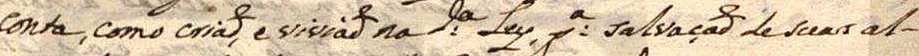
conta, como criaõ, e viviaõ na d:a Ley, p:a salvaçaõ de suas al
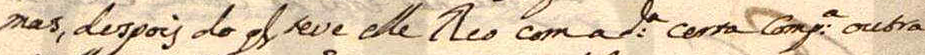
mas, despois do ql teve elle Reo com a d:ta carta Comp:a outra
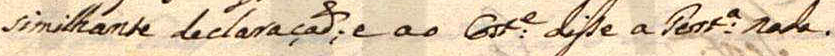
similhante declaraçaõ; e ao Cost:e disse a Test:a nada.
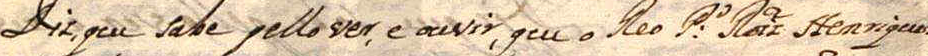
Diz, que sabe pello ver, e ouvir, que o Reo P:o Roiz̄ Henriques
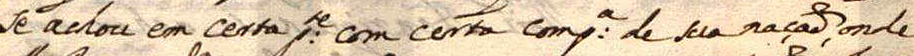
se achou em certa p:te com certa comp:a de sua naçaõ, onde
